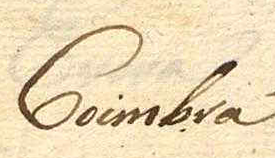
Coimbra
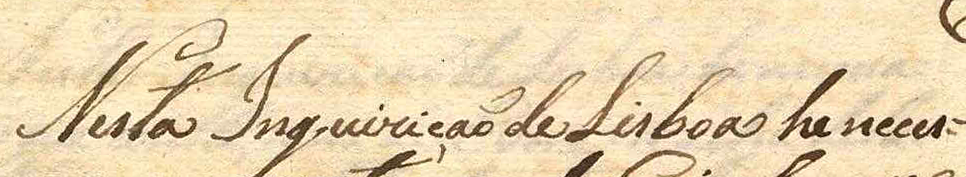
Nesta Inquiziçaõ de Lisboa he neces
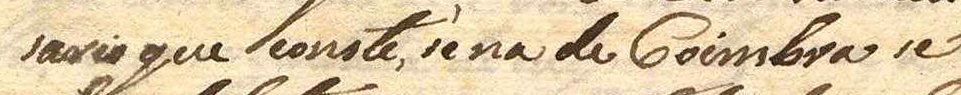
sario que conste, se na de Coimbra se
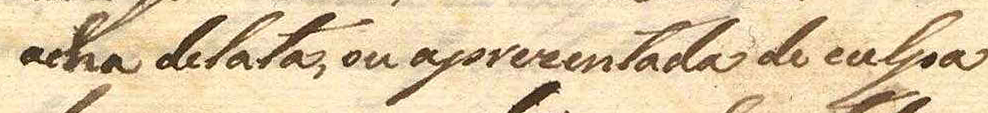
acha delata, ou aprezentada de culpa
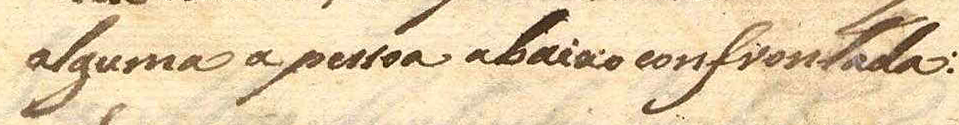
alguma a pessoa abaixo confrontada:
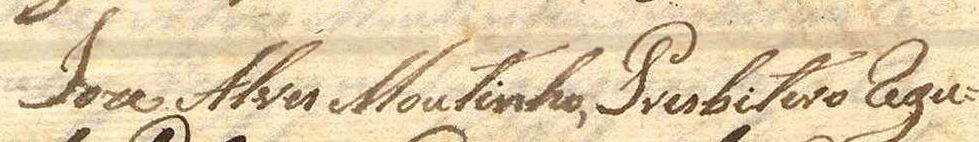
Ioze Alves Moutinho, Presbitero Regu
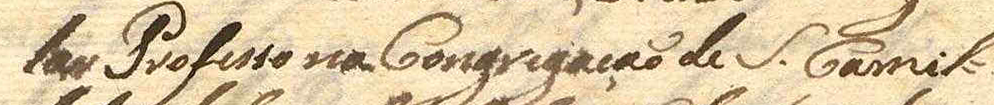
lar Professo na Congregaçaõ de S. Camil
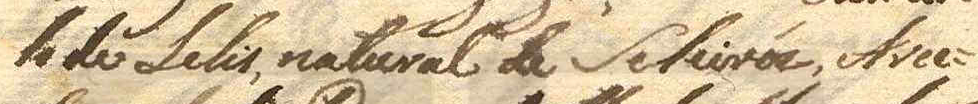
lo de Lelis, natural de Seleiróz, Arce
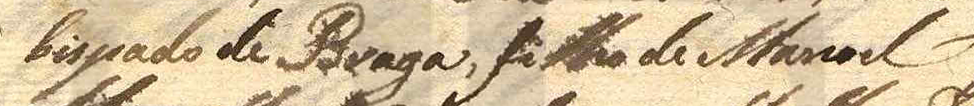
bispado de Braga, filho de Manoel
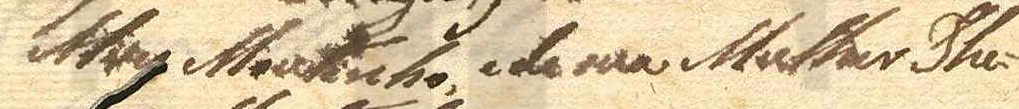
Alves Moutinho, e de sua Mulher The
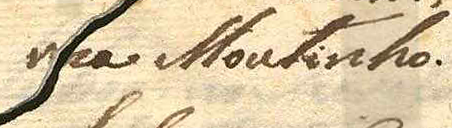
r_za Moutinho.
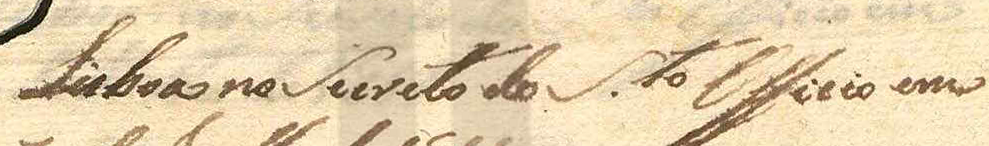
Lisboa no Secreto do S.to Officio em
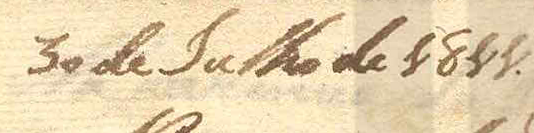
30 de Iulho de 1811.
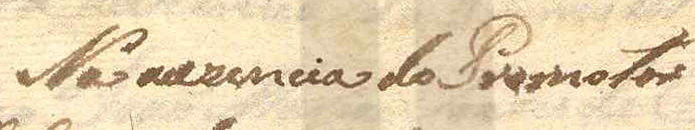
Naõ auzencia do Promotor
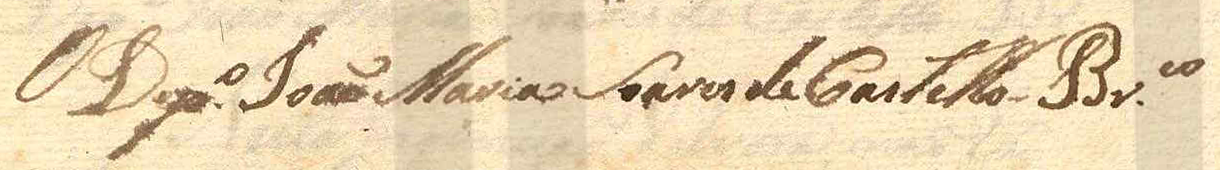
O Dep.o Ioaõ Maria Soares de Castello-Br.co
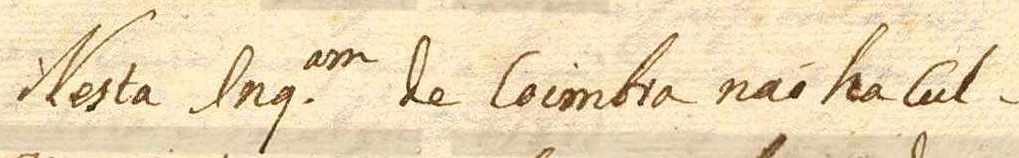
Nesta Inq.am de Coimbra naõ há Cul
